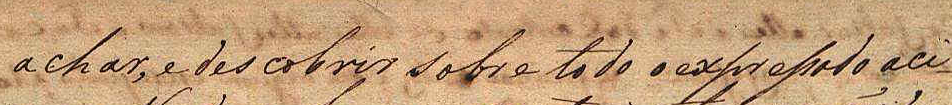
achar, e descobrir sobre todo o expressado aci
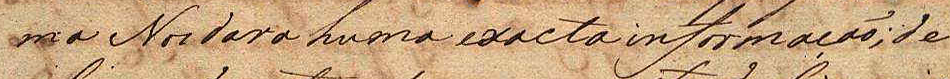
ma Nos dara huma exacta informaçaõ; de
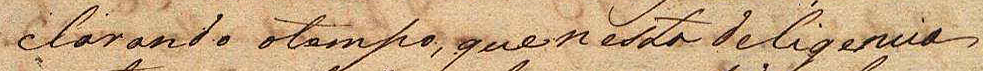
clarando o tempo, que nesta deligencia
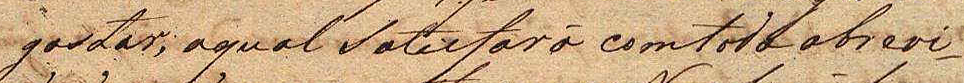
gastar; a qual satisfará com toda a brevi
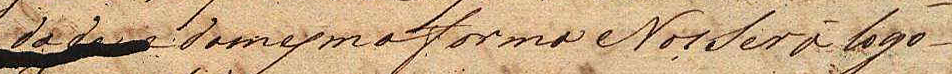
dade e da mesma forma Nos será logo
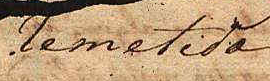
Remetida
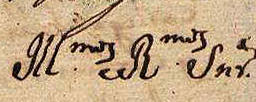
Ill.mos e R.mos Snr.es
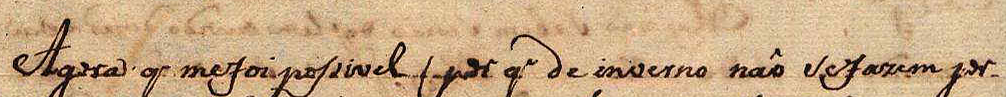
Agora q̄ me foi possivel (porq̄ de inverno naõ se fazem jor
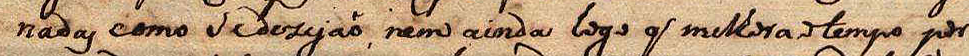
nadas como se dezejaõ, nem ainda logo q̄ melhora o tempo por
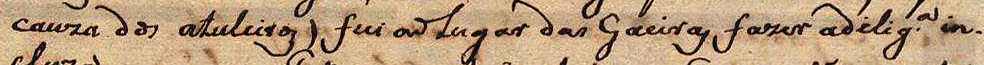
cauza dos atuleiros) fui ao Lugar das Gaeiras, fazer a dilig.a in
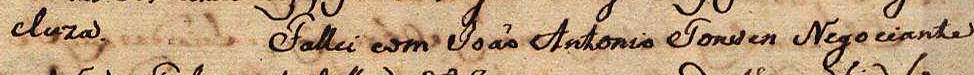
cluza. Fallei com Ioaõ Antonio Tonsen Negociante
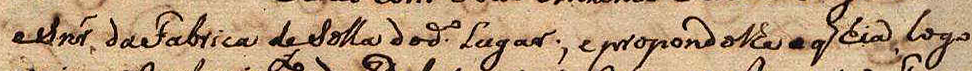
e Snr̄ da Fabrica de Solla do d.o Lugar; e propondolhe a q̄ hia logo
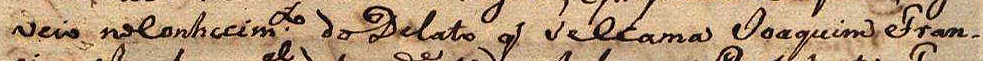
veio no conhecim.to do Delato q̄ se Chama Ioaquim Fran
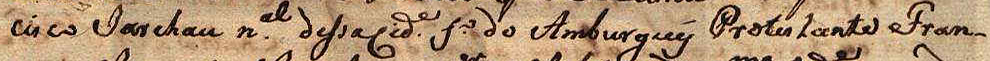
cisco Iarchau n.al dessa Cid.e f.o do Amburgués Protestante Fran
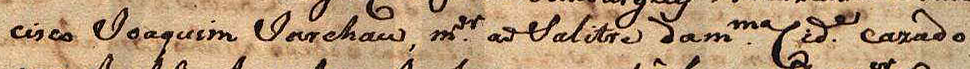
cisco Ioaquim Iarchau, m.or ao Salitre da m.ma Cid.e cazado
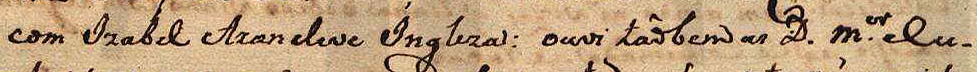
com Izabel Azanclive Ingleza: ouvi taõbem as D. m.er e Cu
